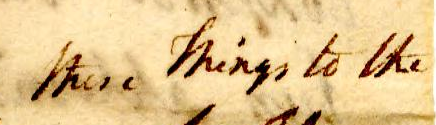these Things to the
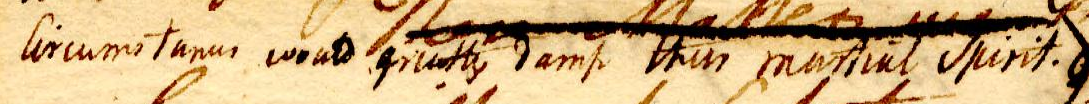Circumstances would greatly damp their marital Spirit.
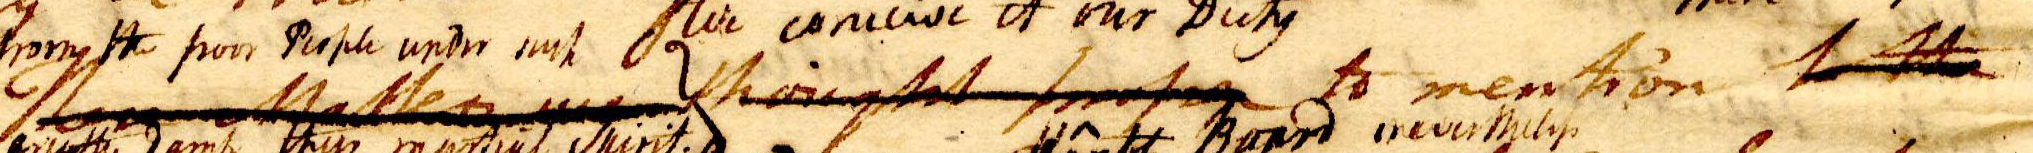[The Matter we] [thought proper] to mention [to the]
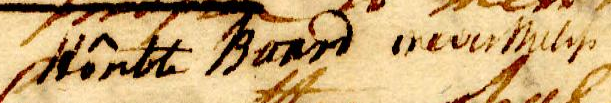Honble Board in everthing.
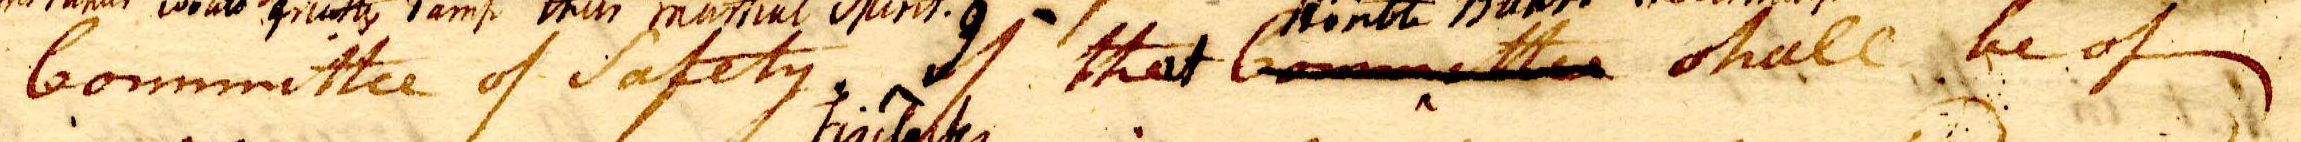Committee of Safety, ^ If that ^ [Committee] shall be of
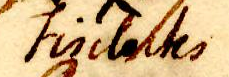Fisclocks
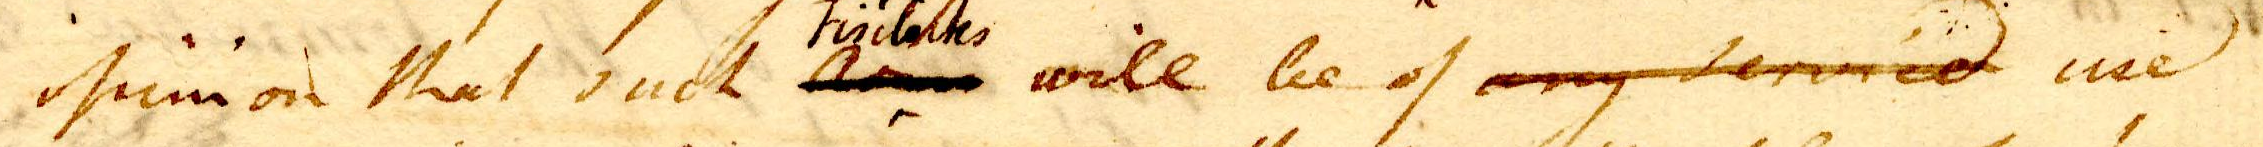open on that such [Arm]s ^ will be of [any service] use
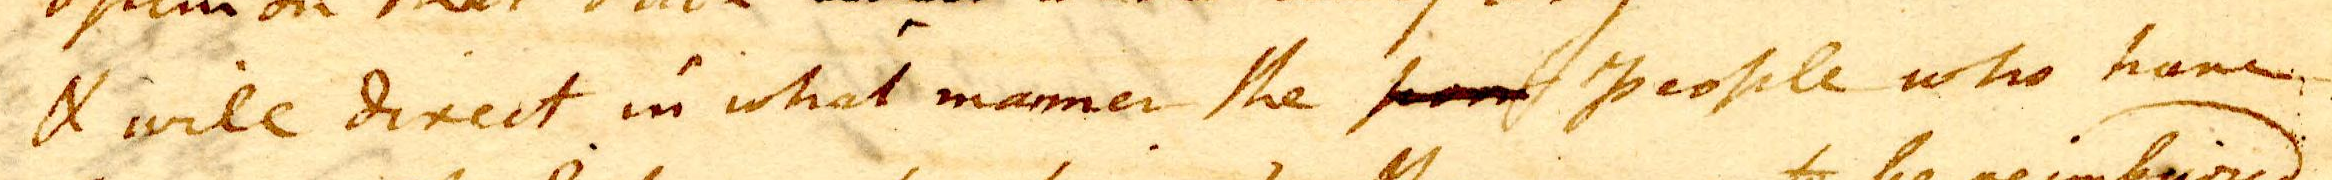& will direct in what manner the [per] people who have.
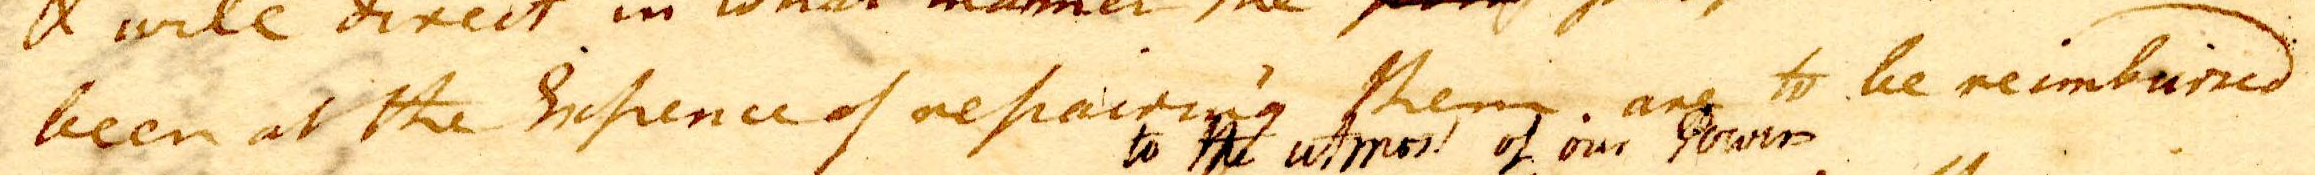been at the Expence of repairing them, are to be reimbursed
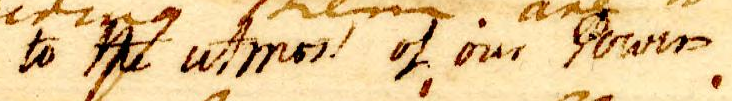to the utmost of our Power
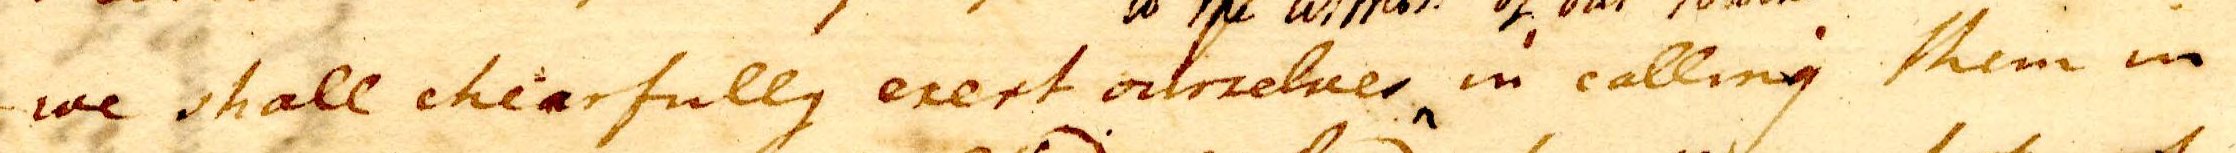we shall chearfully exert ourselves ^ in calling them in
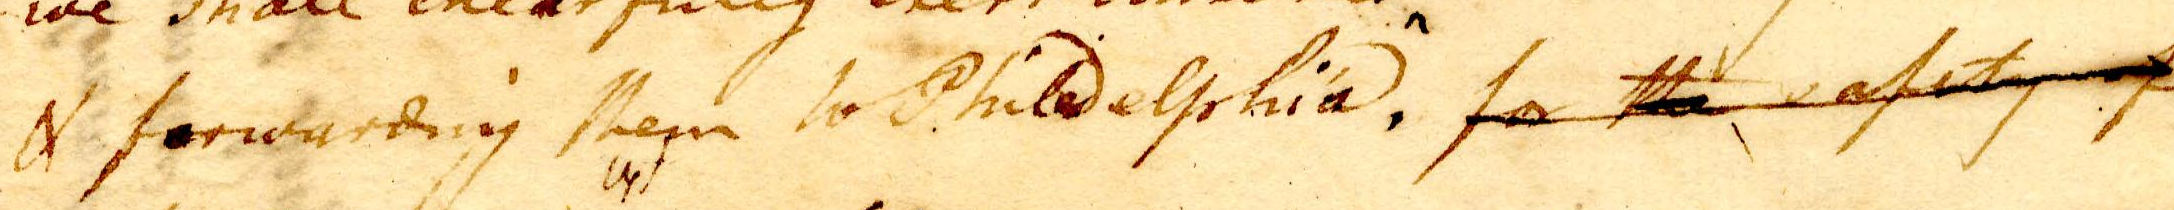& forwarding them to Philadelphia, [for the safety of]
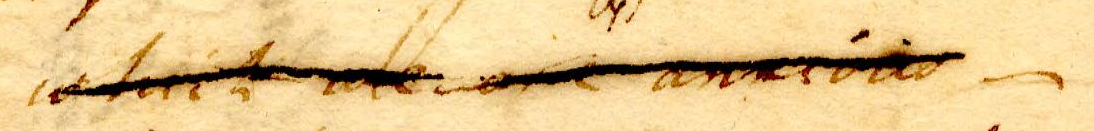[which we] [are anxious]-
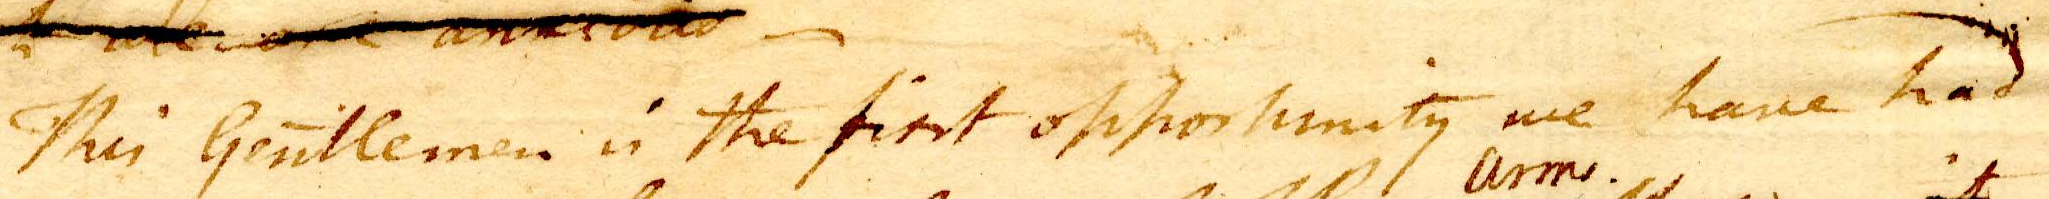This Gentlemen is the first opportunity we have had
